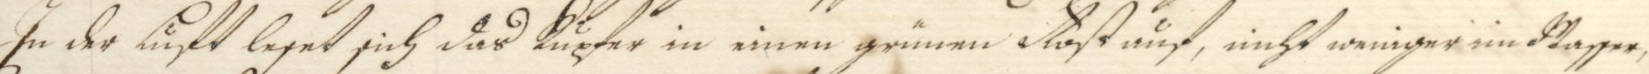In der Luft leset sich das Kupfer in einen grünen Rost auf, nicht weniger im Wasser,
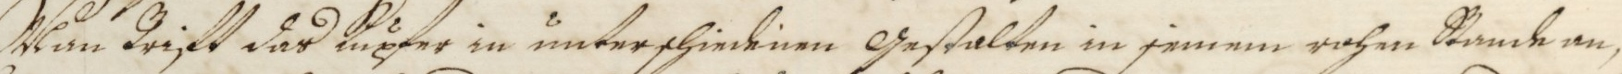Man Trift das Kupfer in unterschiedenen Gestalten in seinem rohen Stande an,
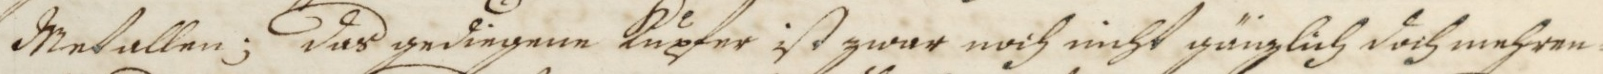Metallen. Das gediegene Kupfer ist zwar noch nicht gänzlich, doch mehren-
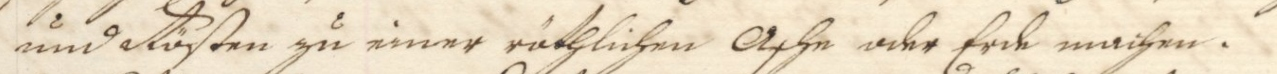und Rösten zu einer röthlichen Asche oder Erde machen.
